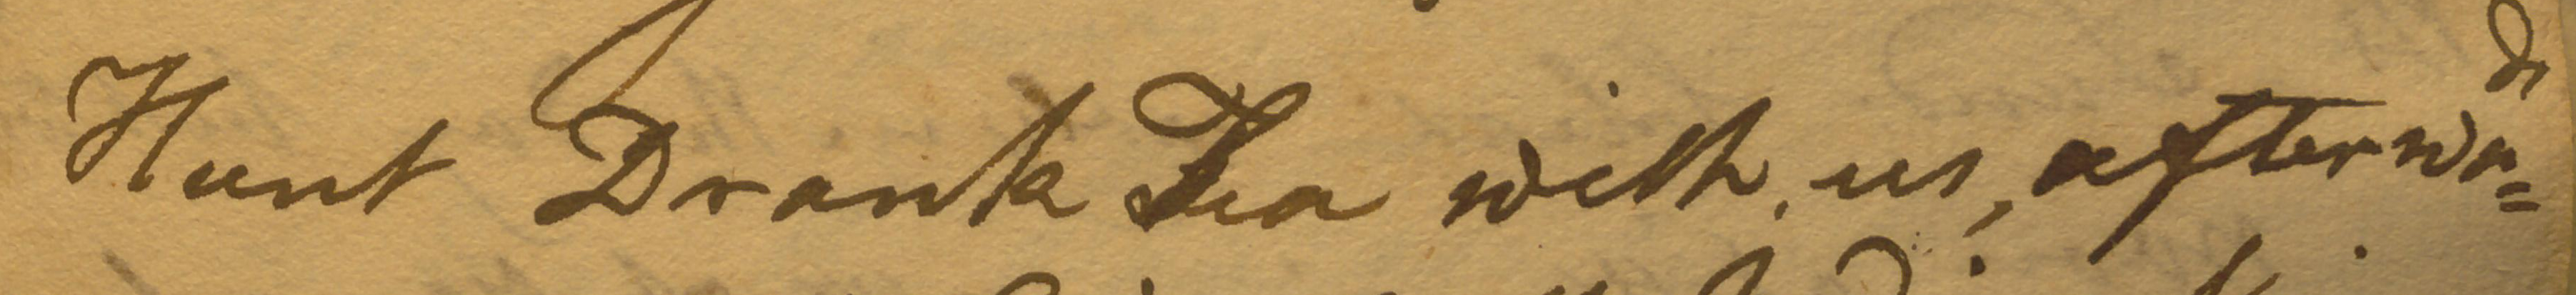Hunt Drank Tea with, us afterwa^ds
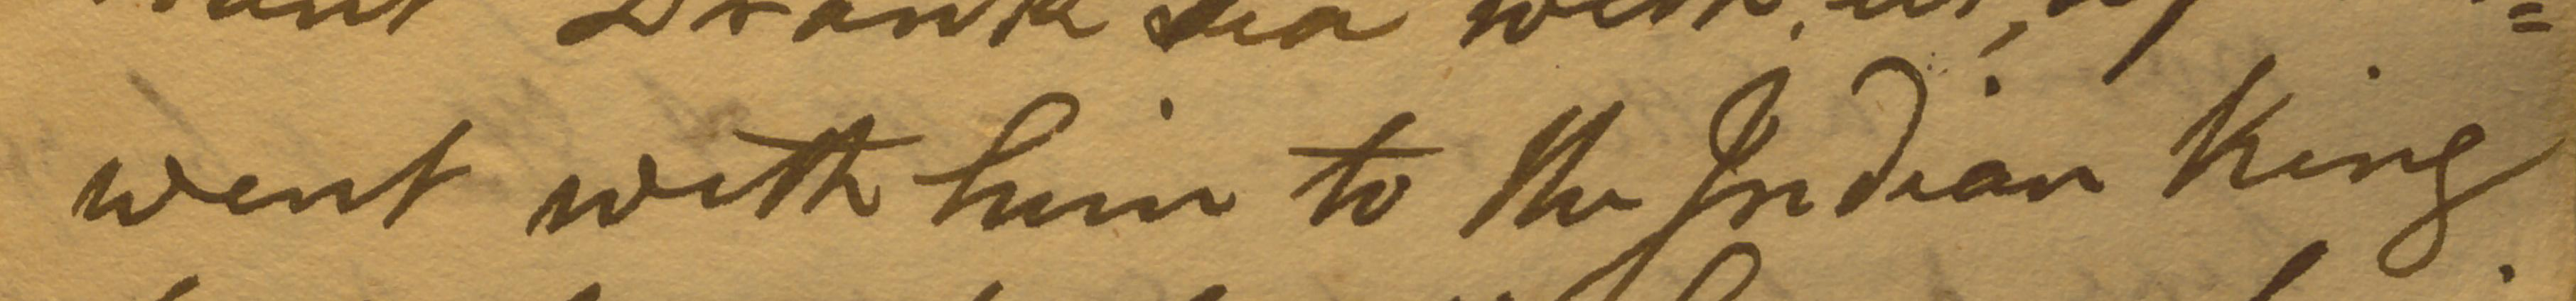went with him to the Indian King
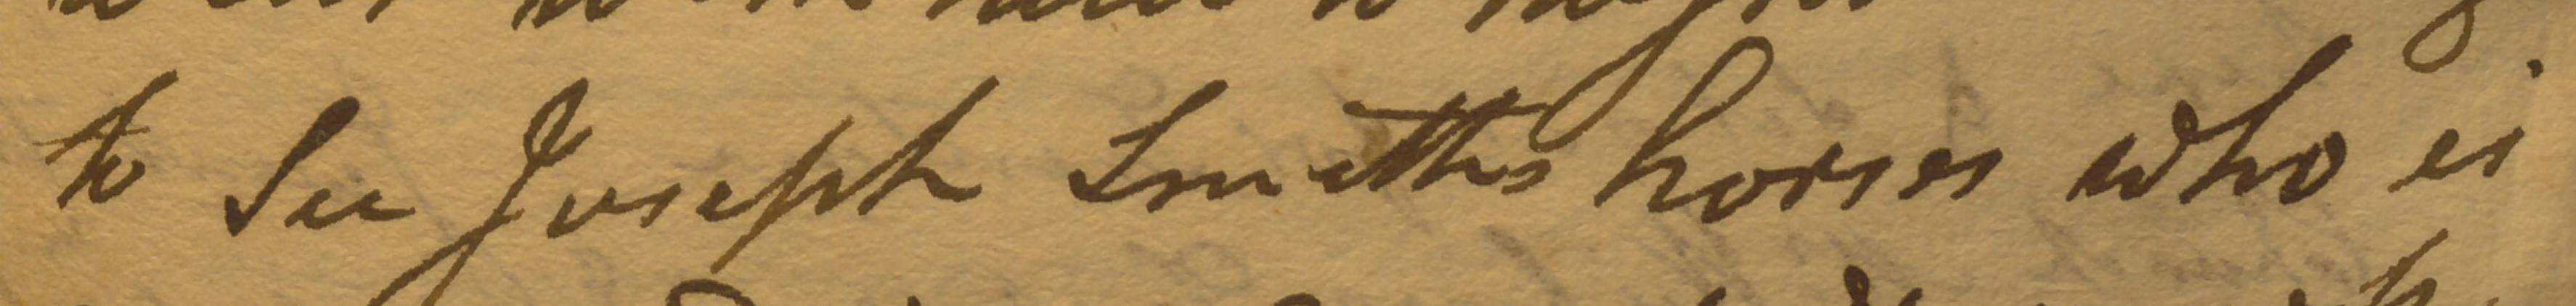to see Joseph Smiths horses who is
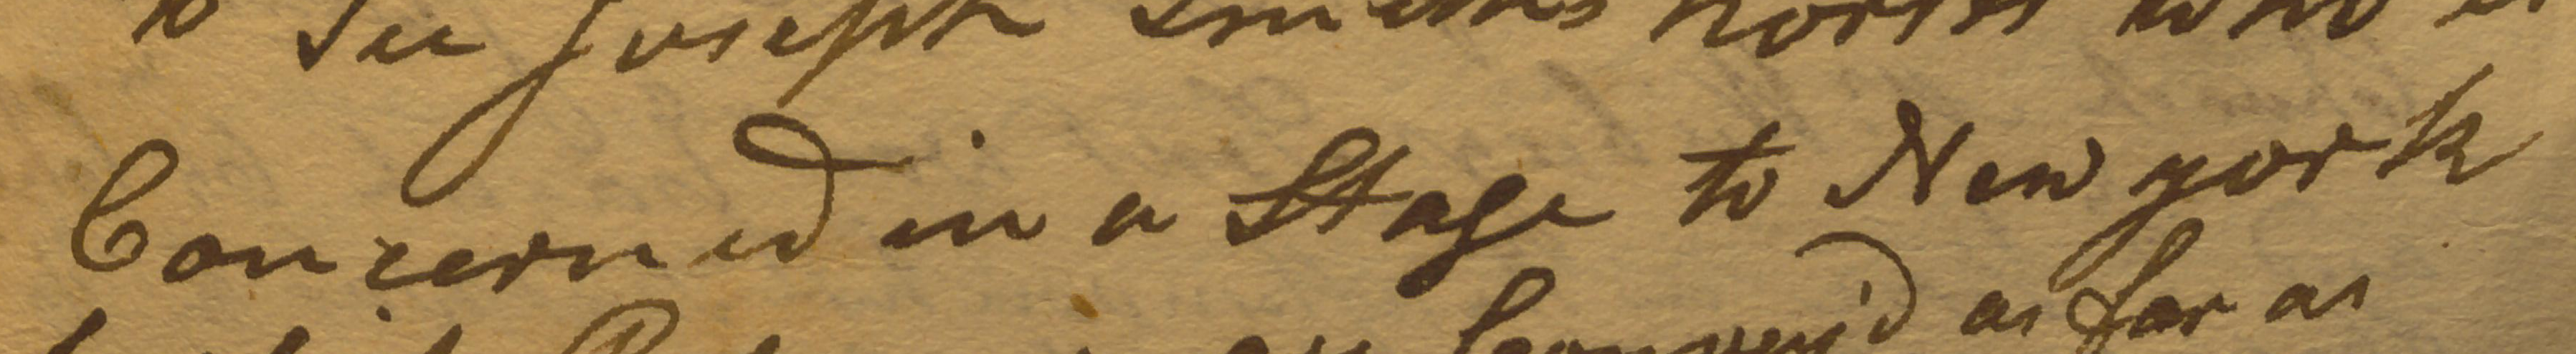Concerned in a stage to New york
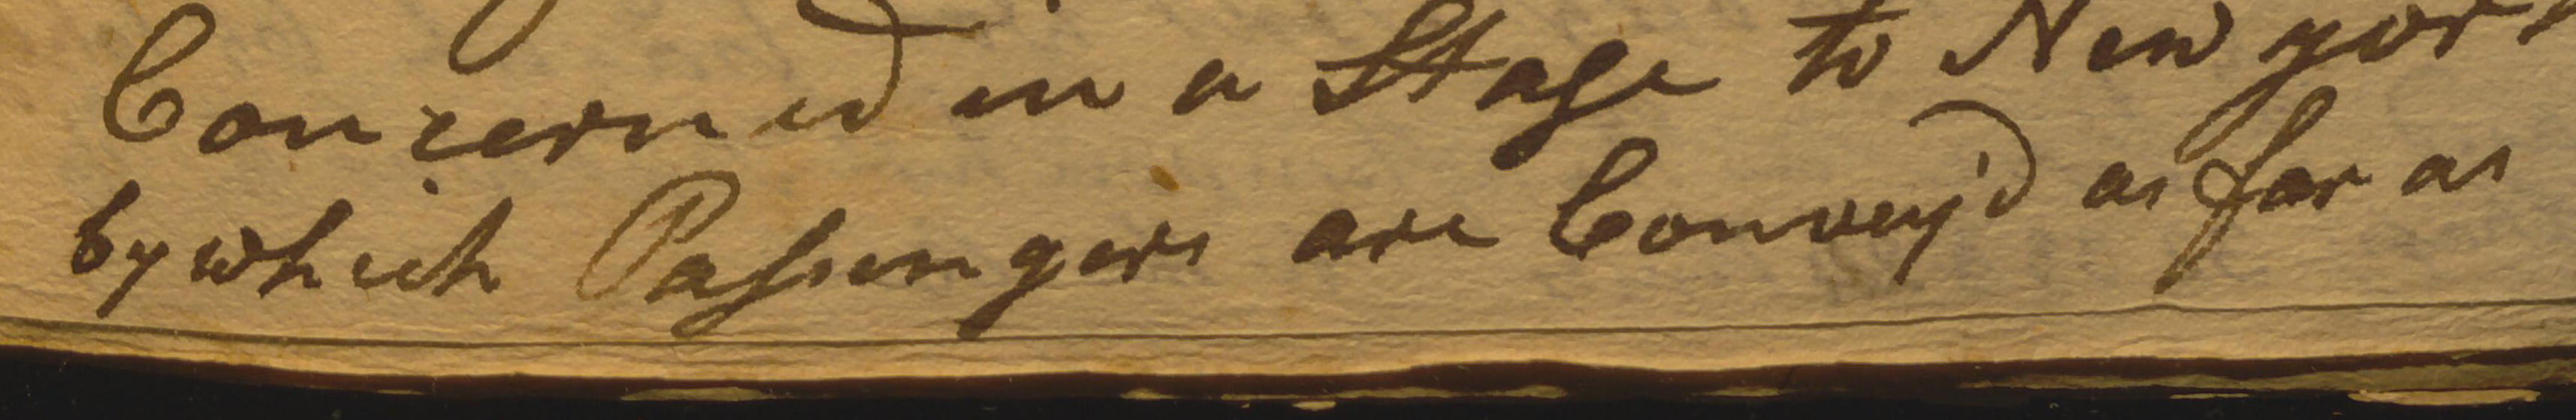by which Passengers are Convey'd as far as
